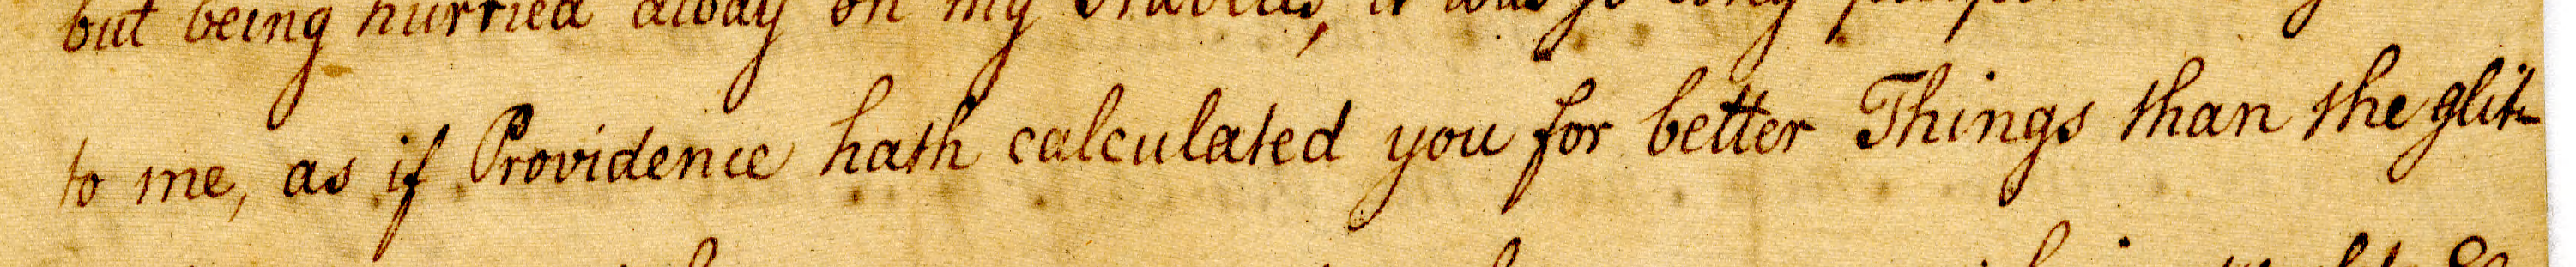to me as if Providence hath calculated you for better Things than the glit
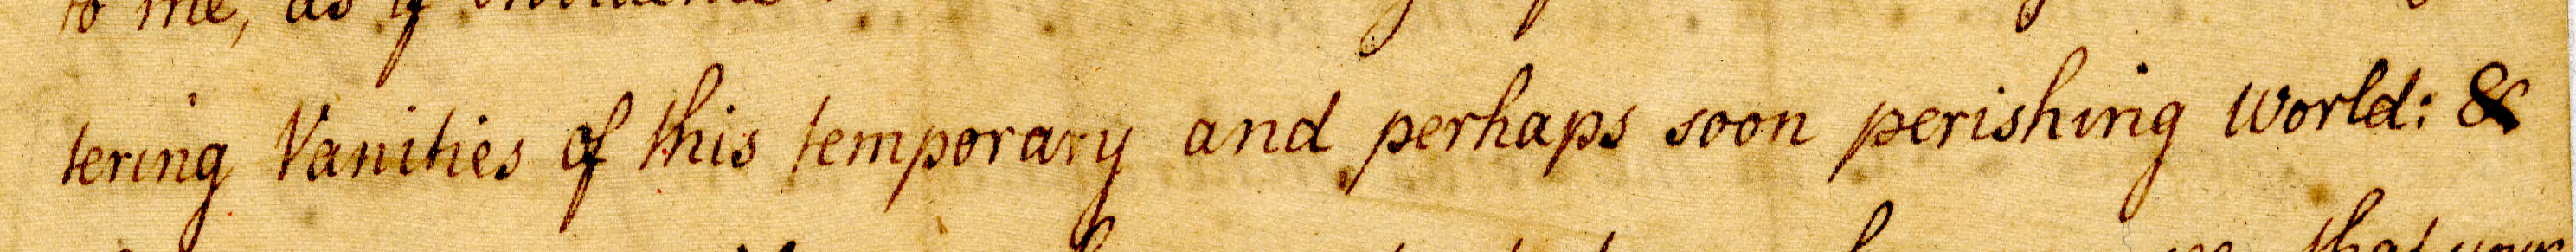tering Vanities of this temporary and perhaps soon perishing world: &
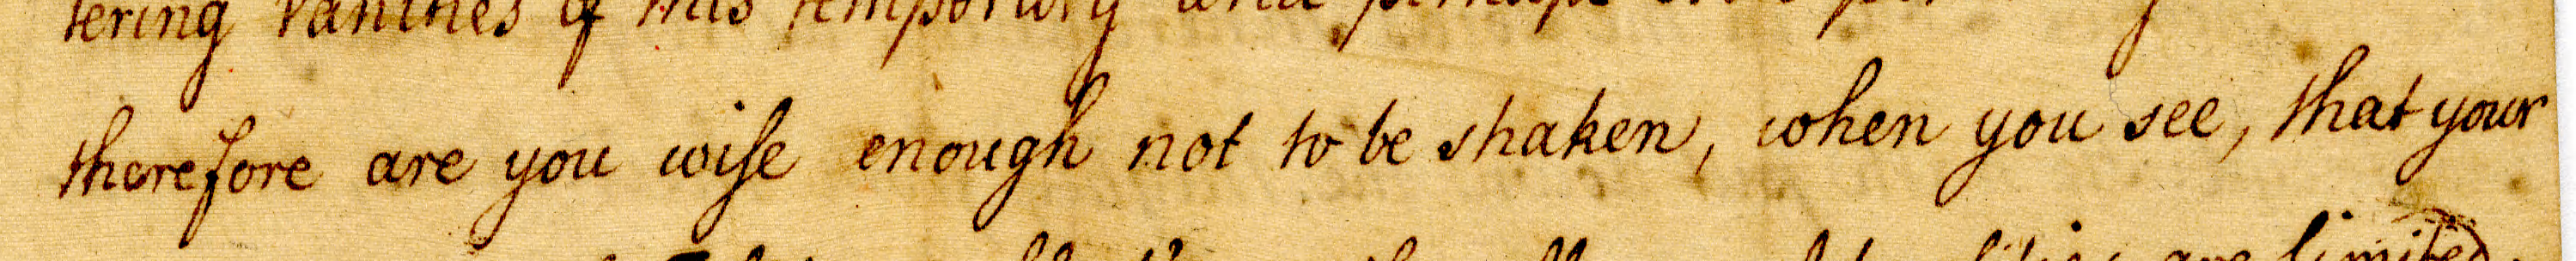therefore are you wise enough not to be shaken, when you see, that your
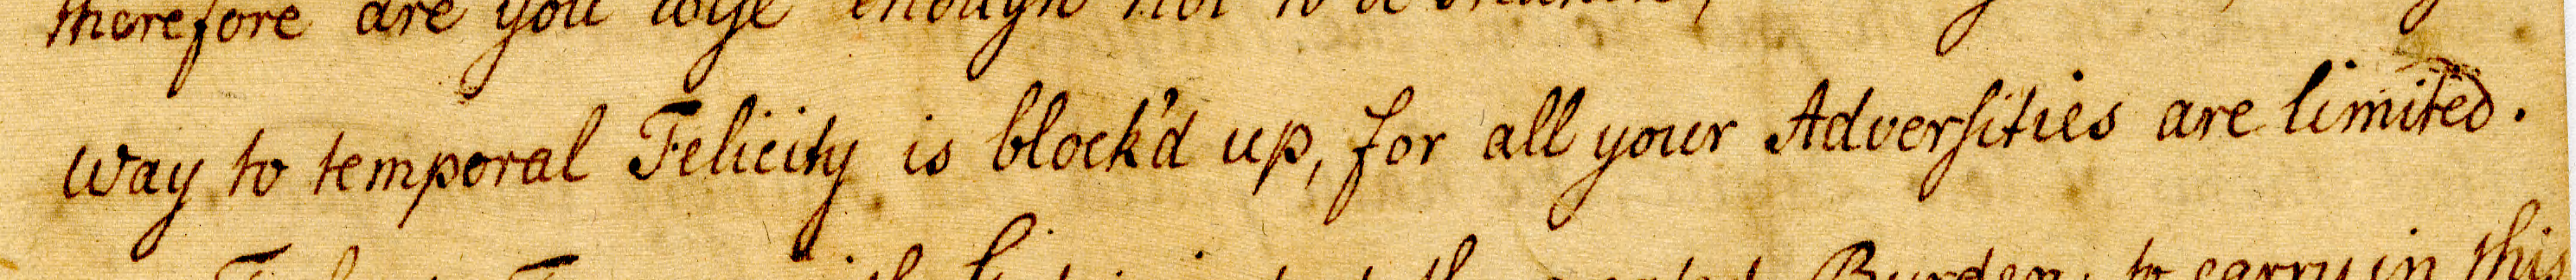way to temporal Felicity is block'd up, for all your Adversities are limited.
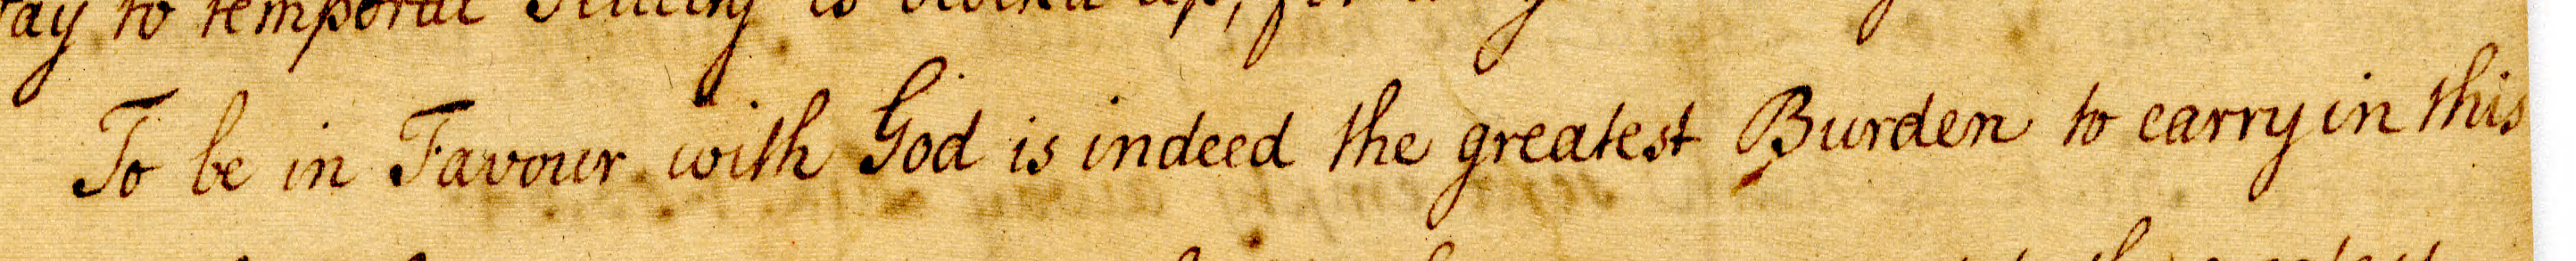To be in Favour with God is indeed the greatest Burden to carry in this
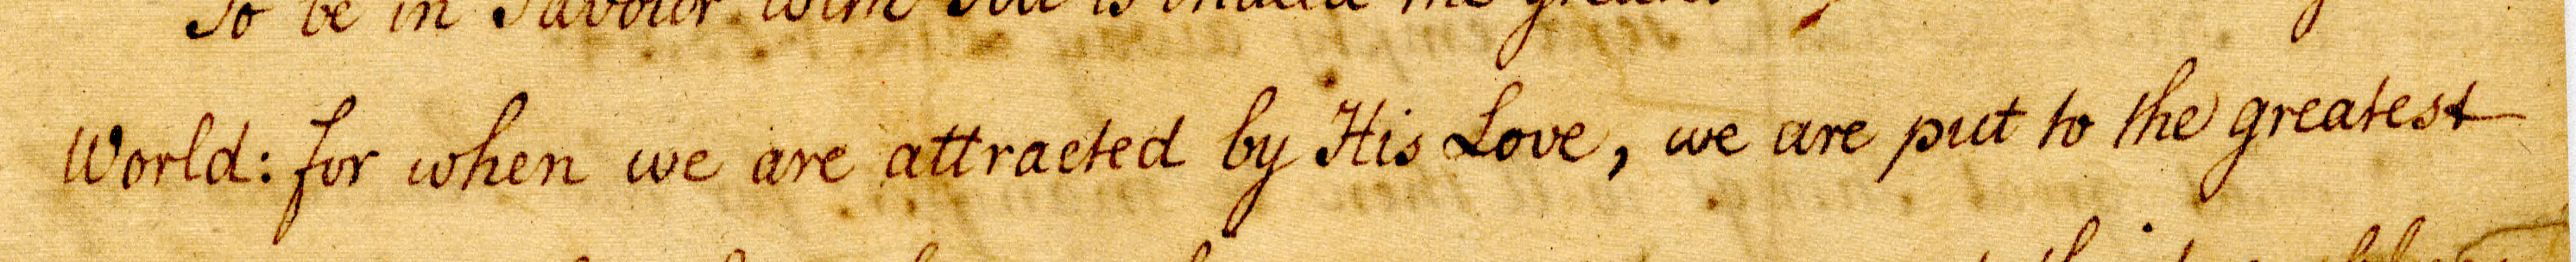World: for when we are attracted by His Love, we are put to the greatest
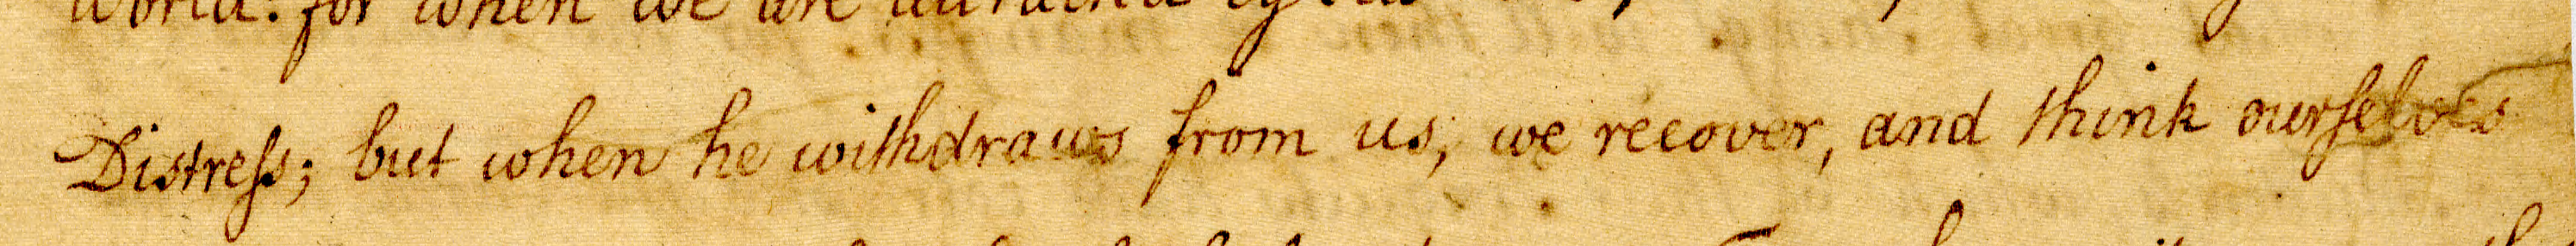Distress; but when he withdraws from us, we recover, and think ourselves
